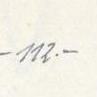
112
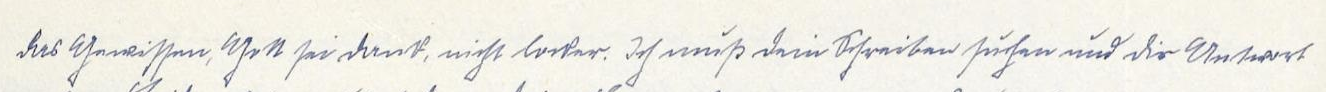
Das Gewissen, Gott sein Dank, nicht locker. Ich muss dein Schreiben suchen und dir Antwort
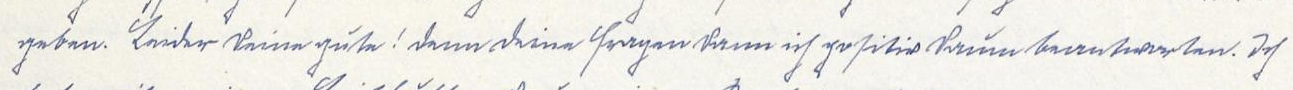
geben. Leider keine gute! Denn deine Fragen kann ich positiv kaum beantworten. Ic
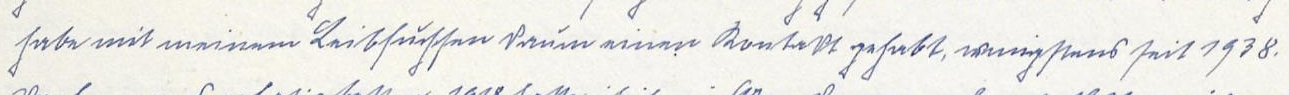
habe mit meinem Leibfuchsen kaum einen Kontakt gehabt, wenigstens seit 1938.
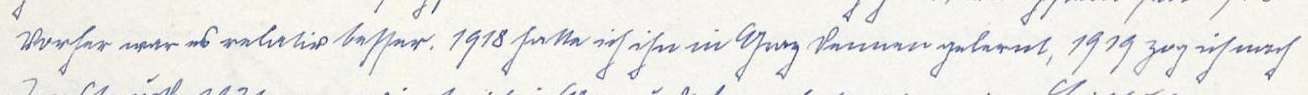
Vorfer war es relativ besser. 1918 hatte ich ihn in Graz kennen gelernt, 1919 zog ich nach
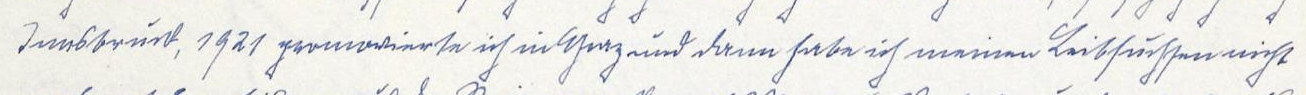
Innsbruck, 1921 promovierte ich in Graz und dann habe ich meinen Leibfuchsen nicht
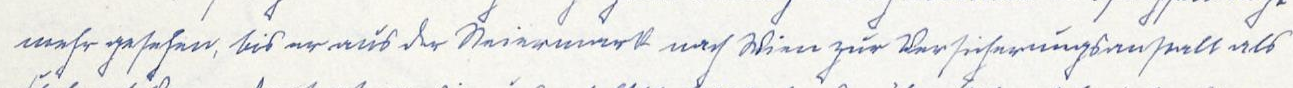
mehr gesehen, bis der aus der Steiermark nach Wien zur Versicherungsanstalt als
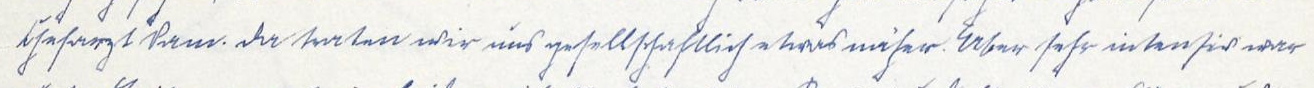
Chefarzt kam. Da traten wir uns gesellschaftlich etwas näher. Aber sehr intensiv war
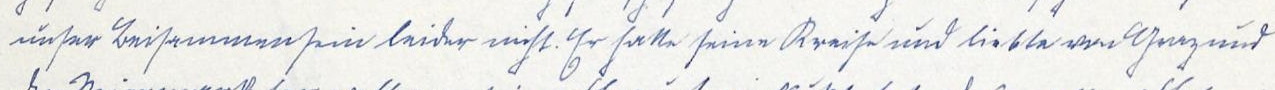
unser Beisammensein leider nicht. Er hatte seine Kreise und liebte von Graz und
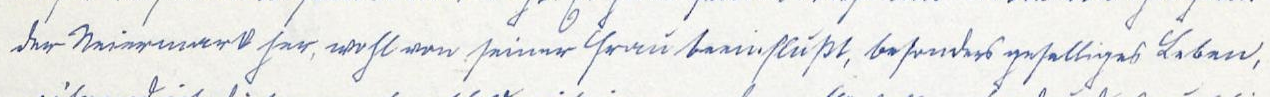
der Steiermark her, wohl von seiner Frau beeinflußt, besonders geselliges Leben,
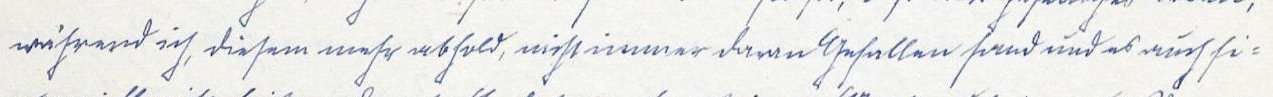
während ich diesem mehr abhold, nicht immer daran Gefallen fand und es auch fi-
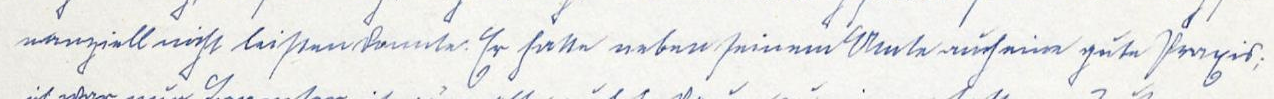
nanziell nicht leisten konnte. Er hatte neben seinem Amte auch eine gute Praxis;
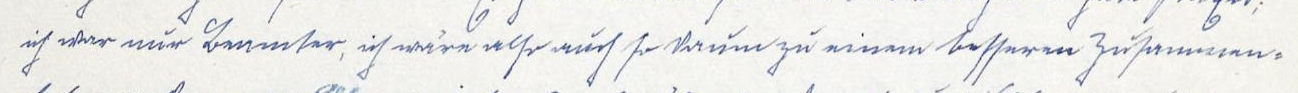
ich war nur Beamter, ich wäre also auch so kaum zu einem bessere Zusammen-
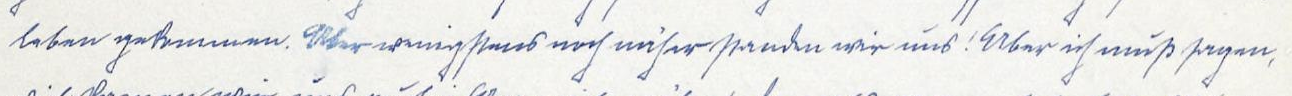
leben gekommen. Aber wenigstens noch näherstanden wir uns! Aber ich muss sagen,
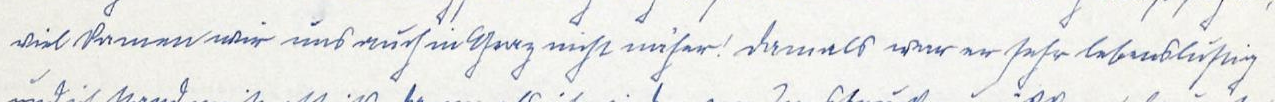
viel kamen wir uns auch in Graz nicht näher! Damals war er sehr lebenslustig
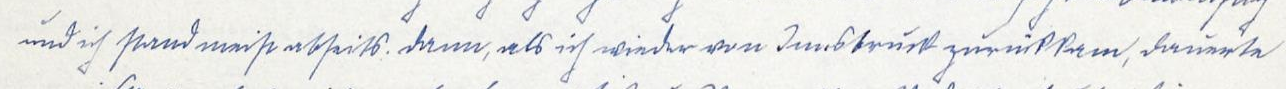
und ich stand meist abseits. Dann, als ich wieder von Innsbruck zurükkam, dauerte
